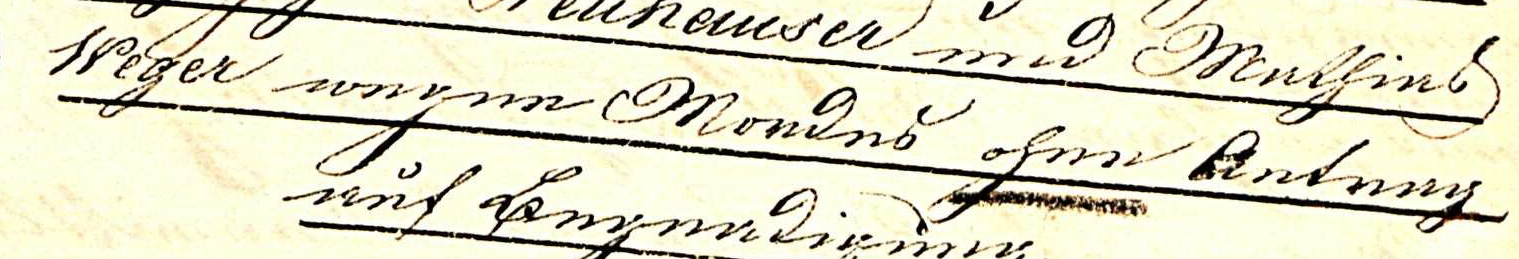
Weger wegen Mordes ohne Antrag
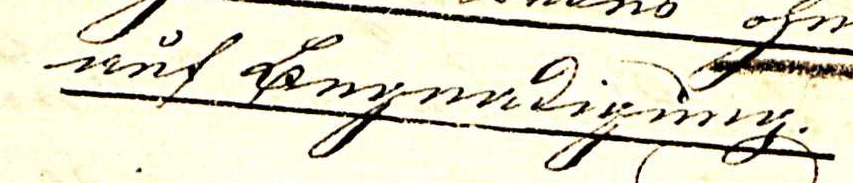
auf Begnadigung
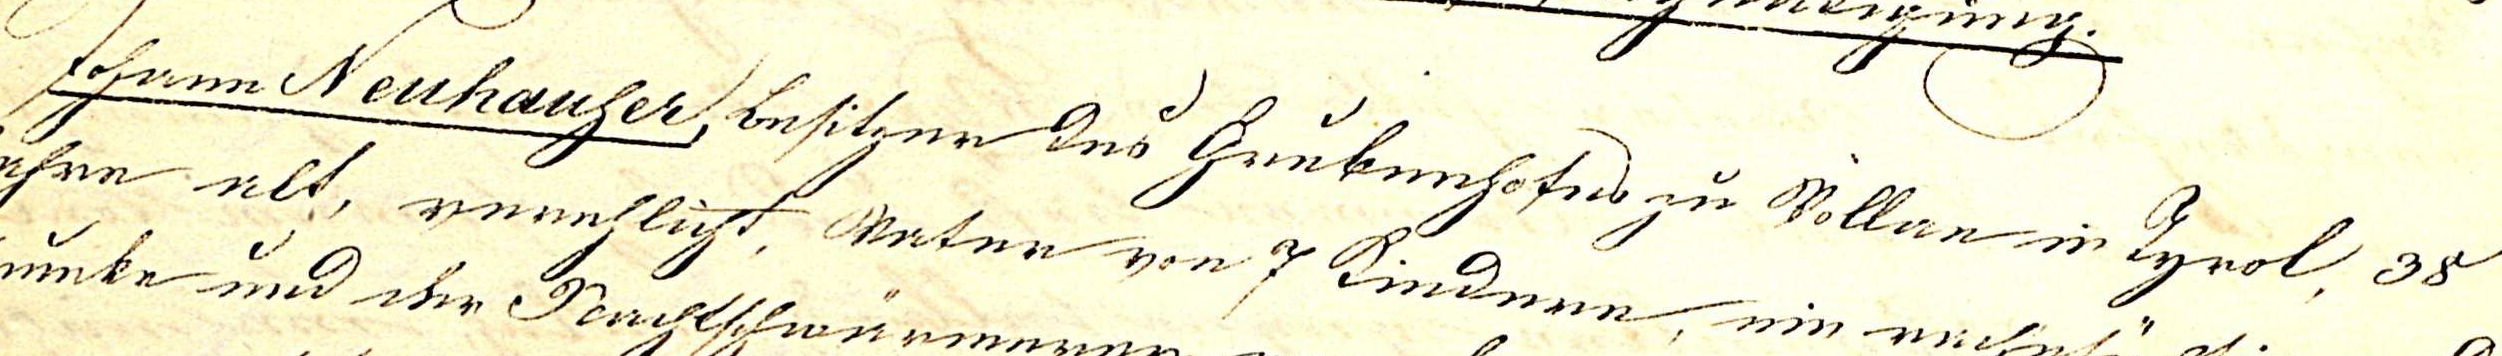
Johann Neuhauser, Besitzer des Grubenhofes zu Vollan in Tyrol, 38
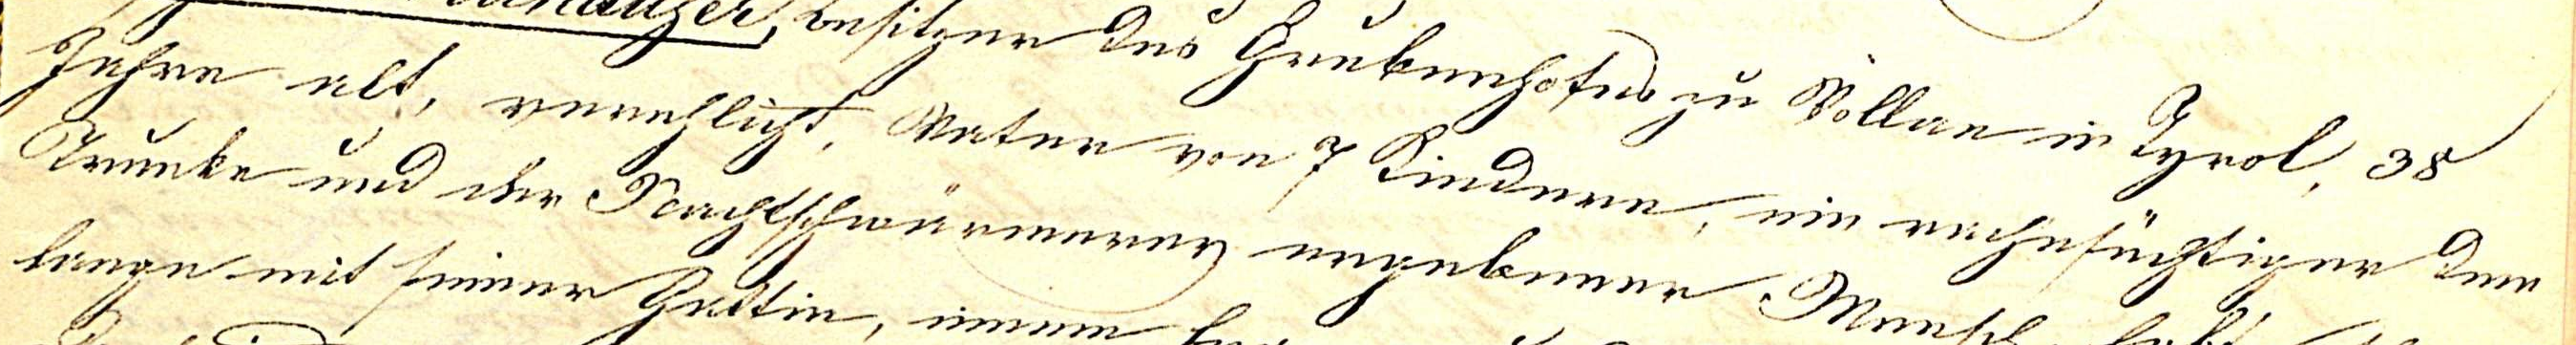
Jahre alt, verehlicht, Vater von 7 Kindern, eine rachesüchtiger dem
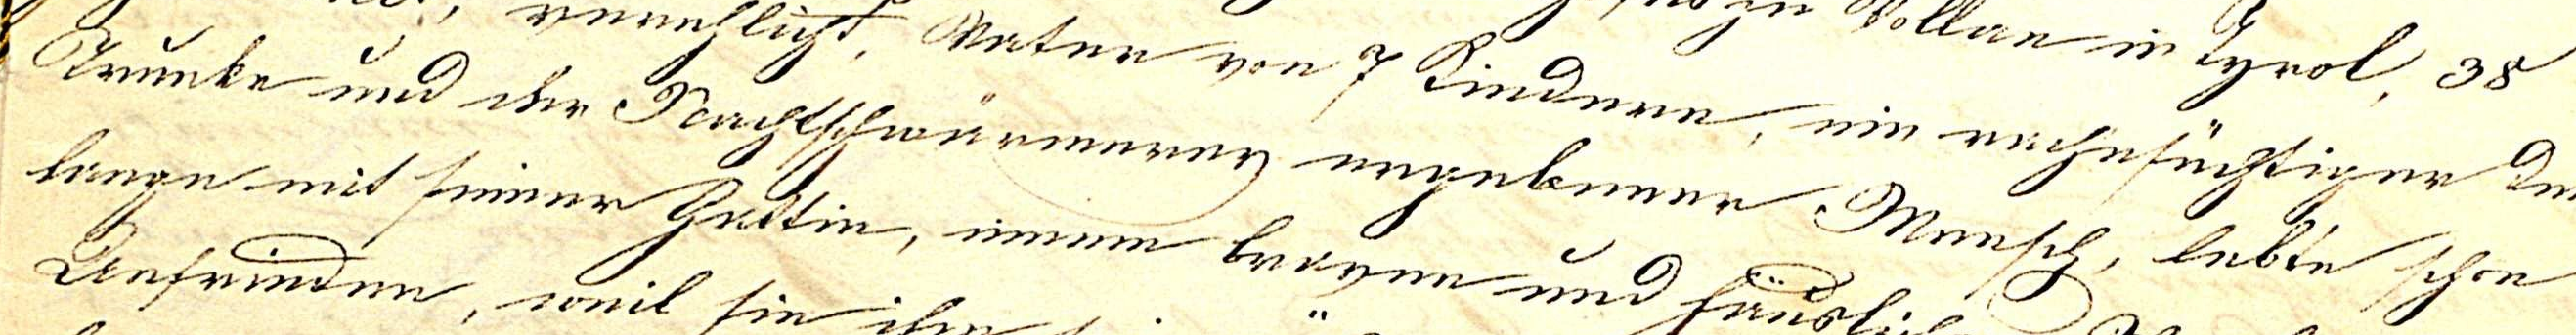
Trunke und der Nachtschwärmerey ergebener Mensch, lebte schon
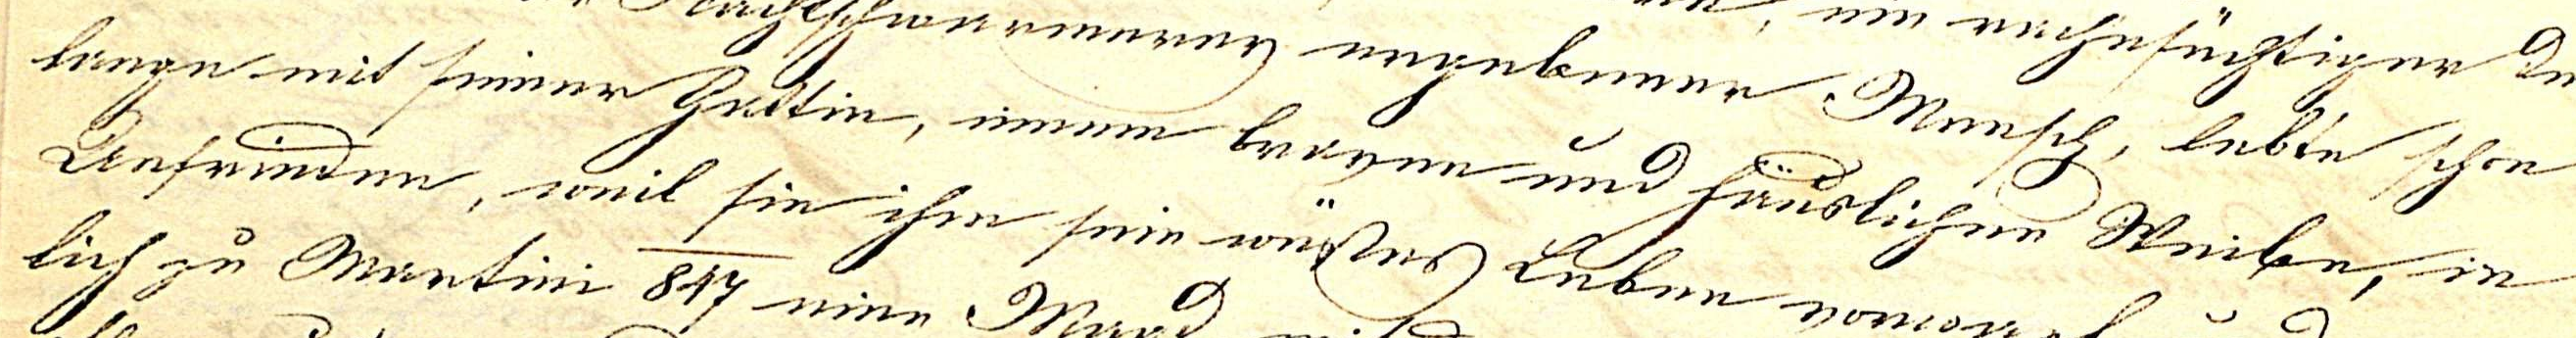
lange mit seiner Gattin, einem braven und häuslichen Weibe, in
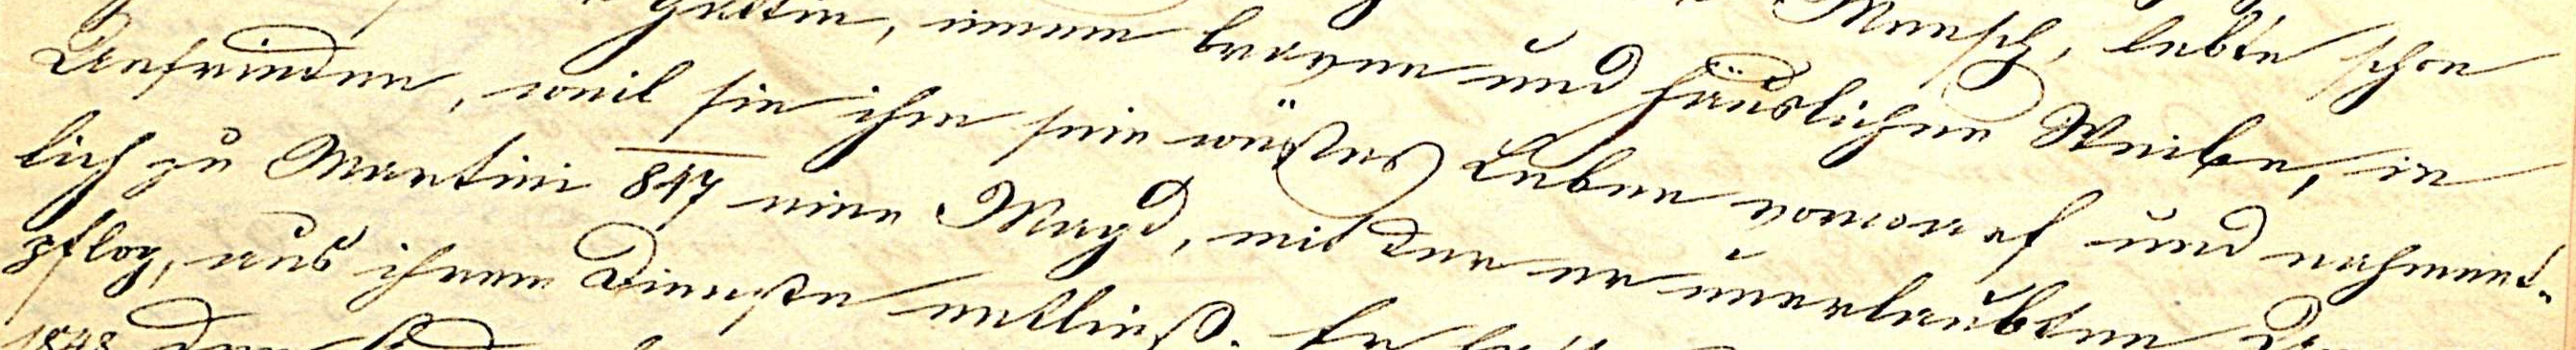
Unfrieden, weil sie ihm sein wüstes Leben vorwarf und nahment¬
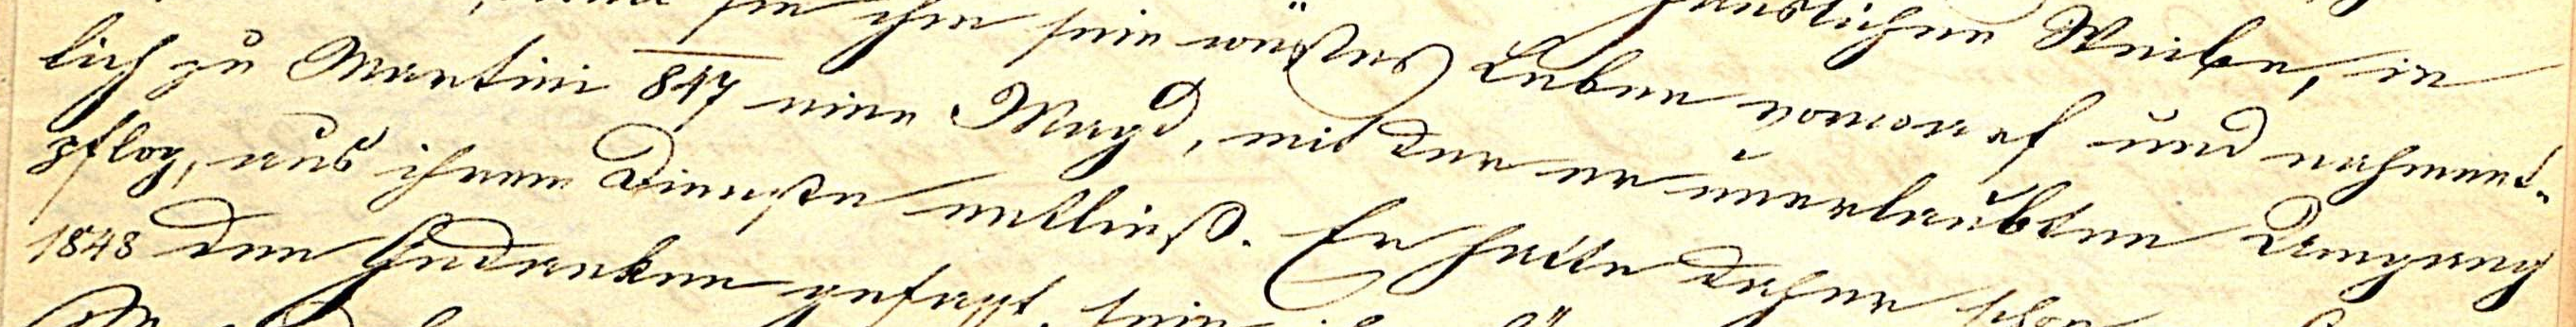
lich zu Martini 847 eine Magd, mit der er unerlaubten Umgang
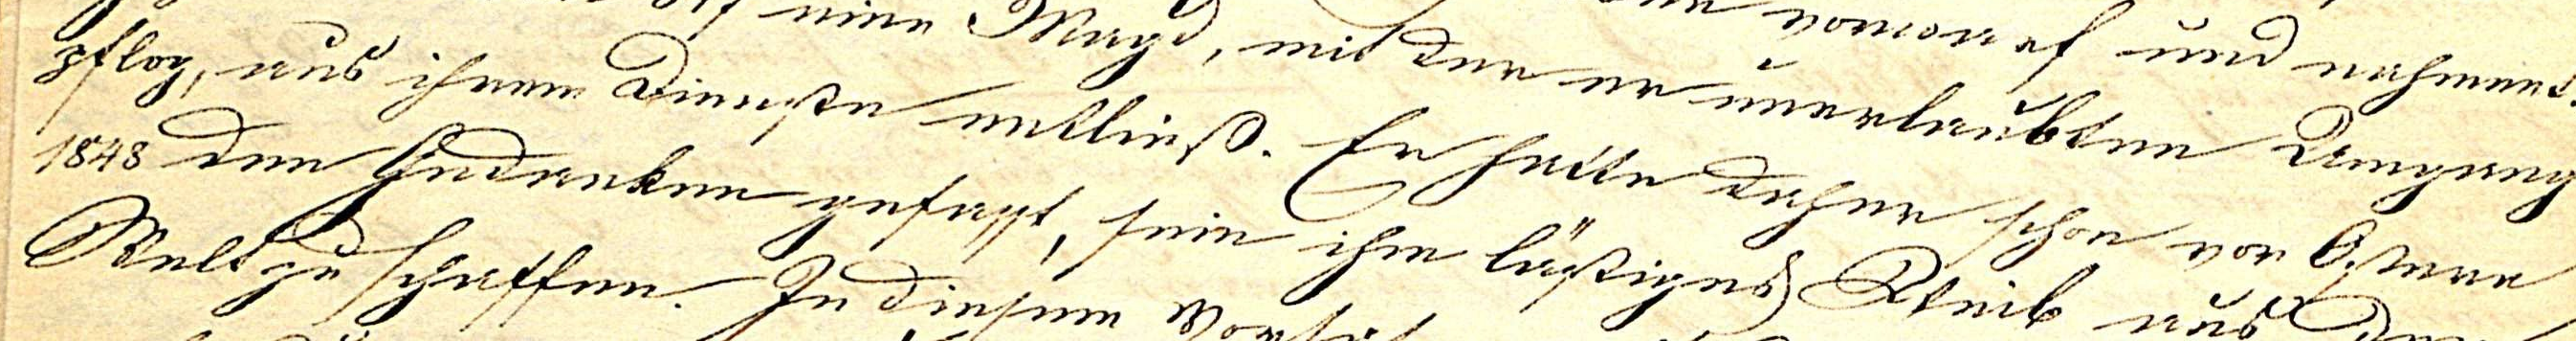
pflog, aus ihrem Dienste entließ. Er hatte daher schon vor Ostern
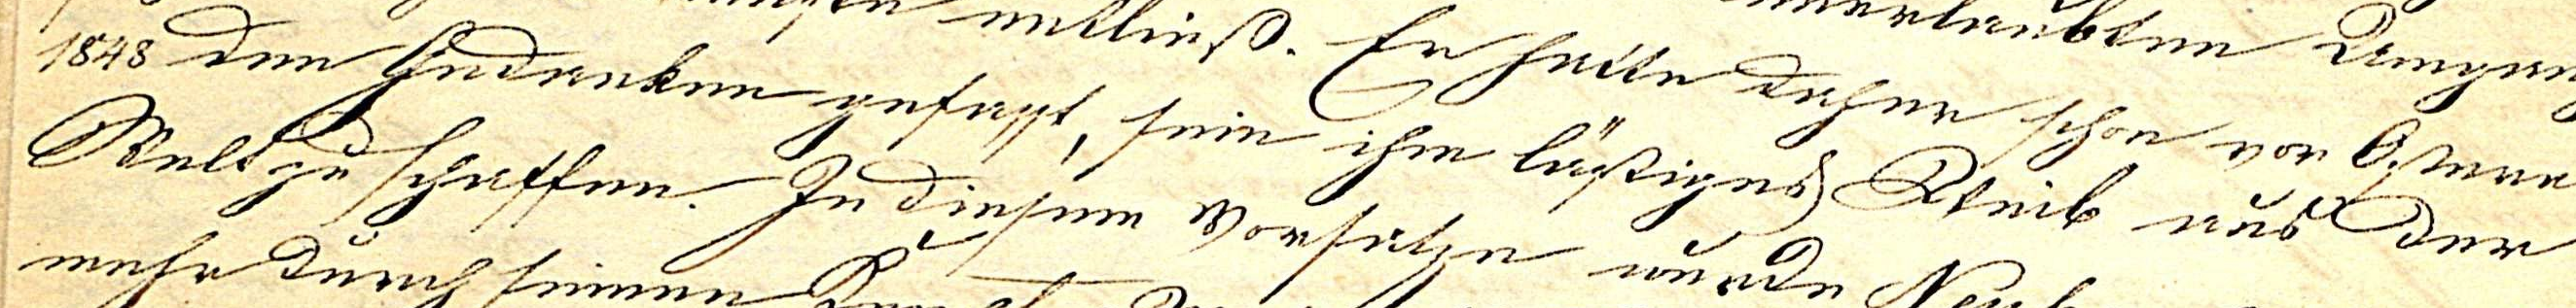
1848 den Gedanken gefasst, sein ihm lästiges Weib aus der
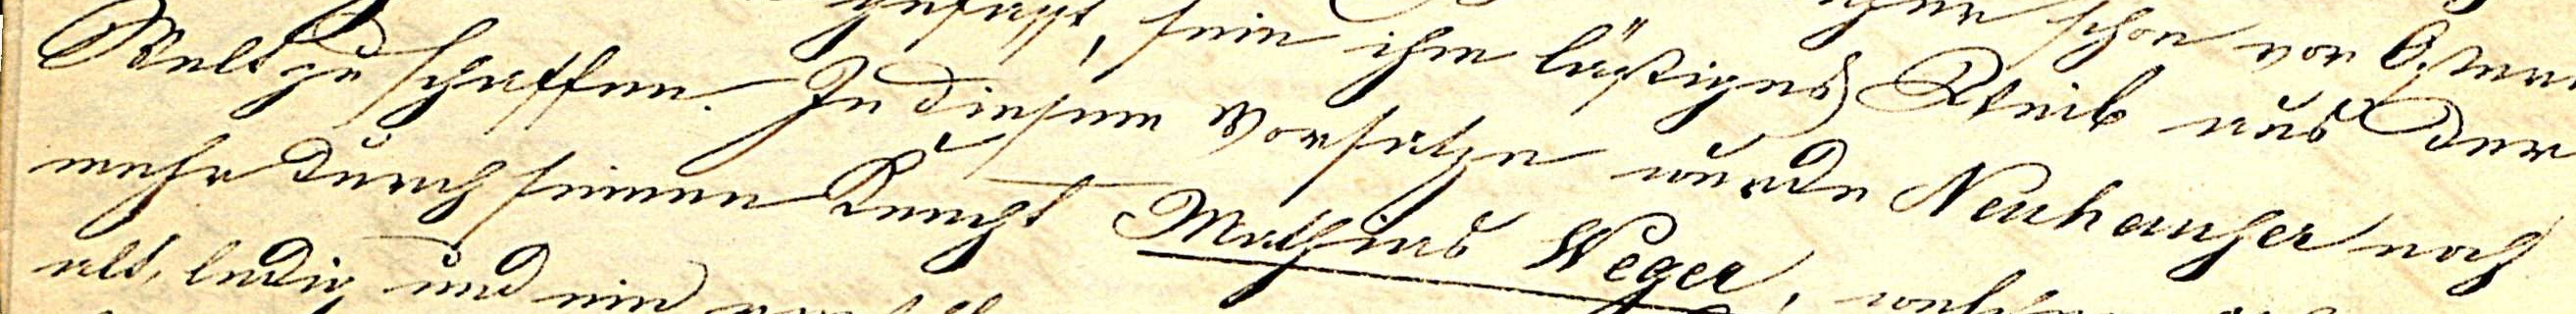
Welt zu schaffen. In diesem Vorsatze wurde Neuhauser noch
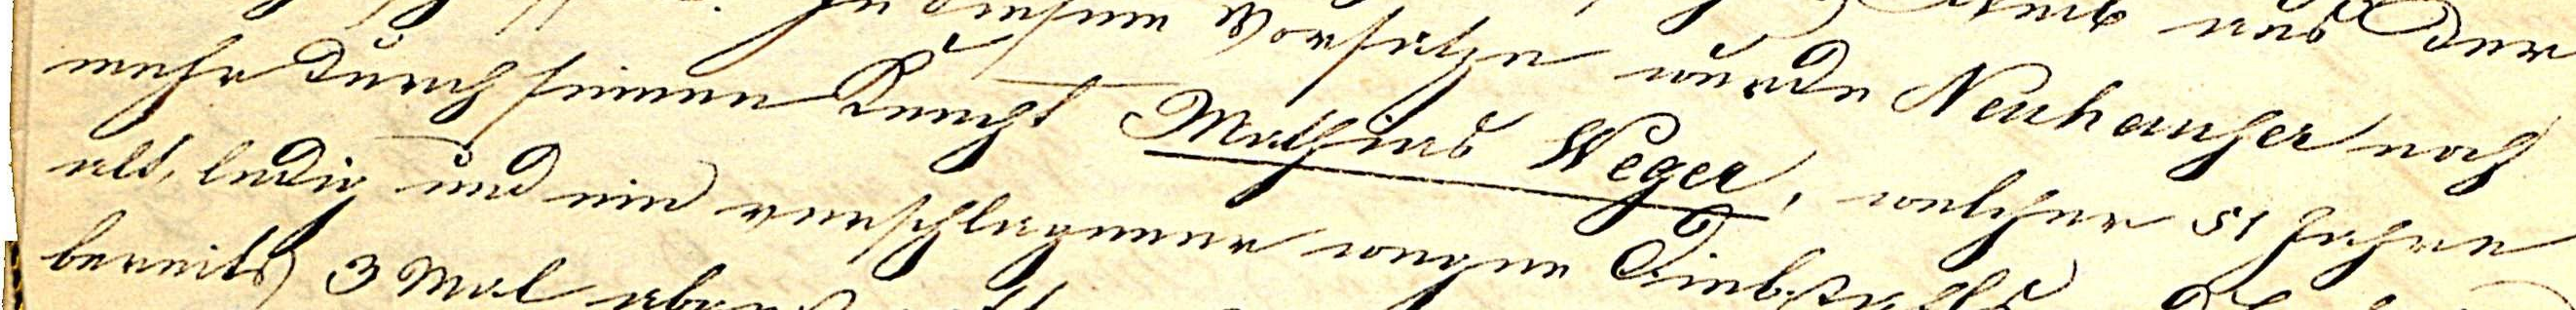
mehr durch seinen Knecht Mathias Weger, welcher 51 Jahre
